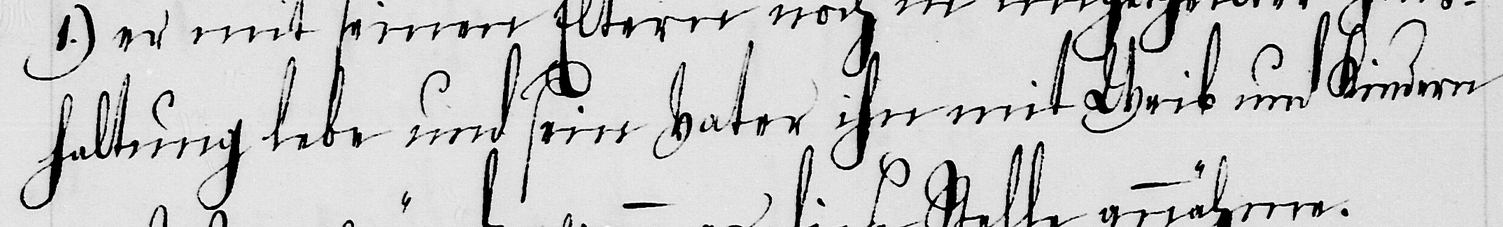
haltung lebe und sein Vater ihn mit Weib und Kindern
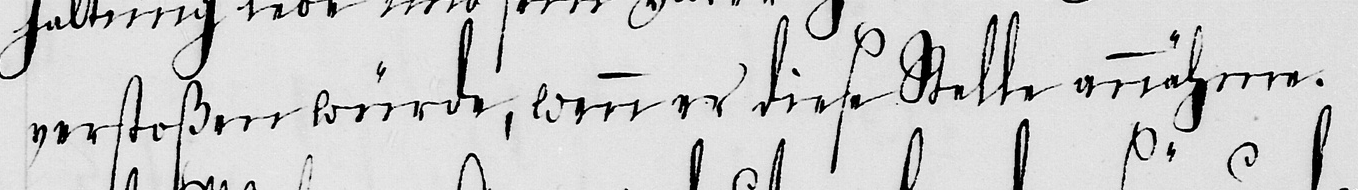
verstoßen würde, wenn er diese Stelle annähme.
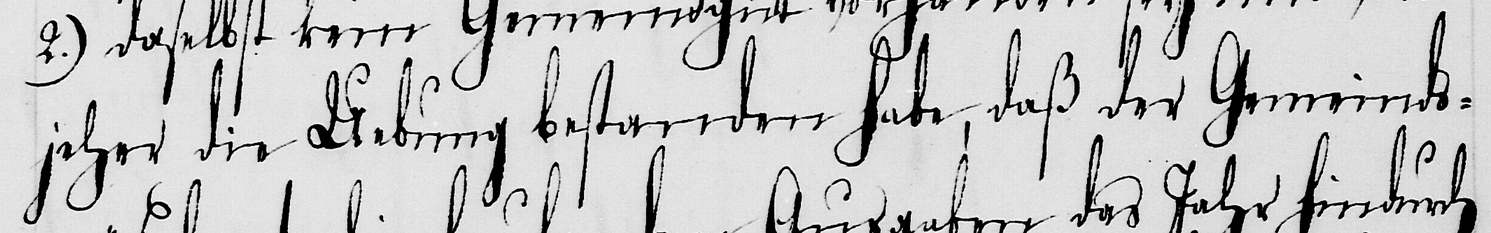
jeher die Uebung bestanden habe, daß der Gemeinds¬
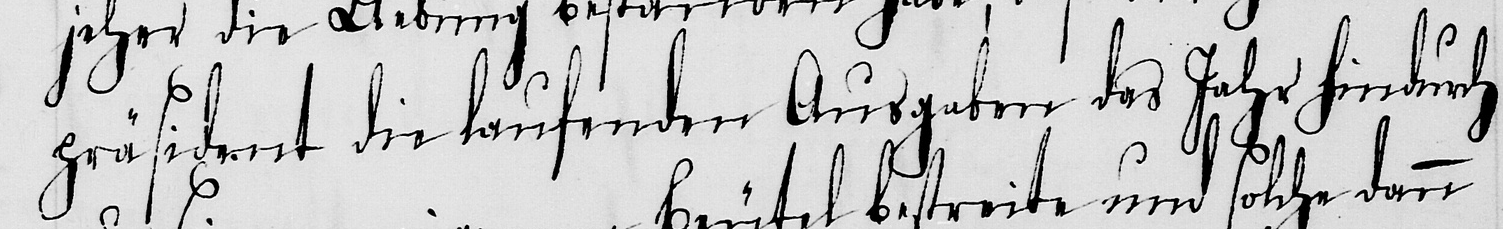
präsident die laufenden Ausgaben das Jahr hindurch
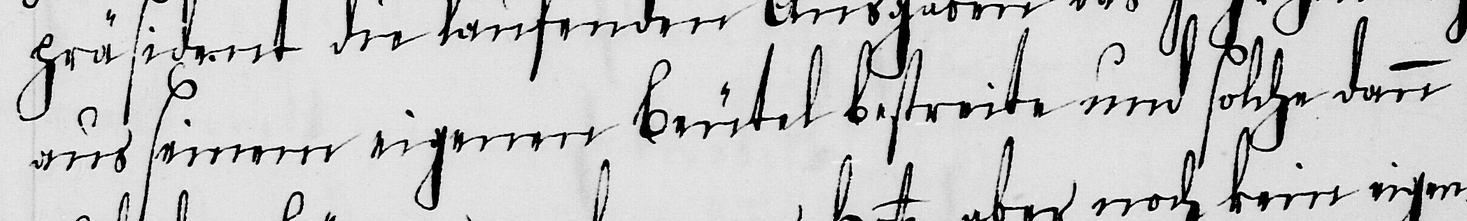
aus seinem eigenen Beutel bestreite und solche dann
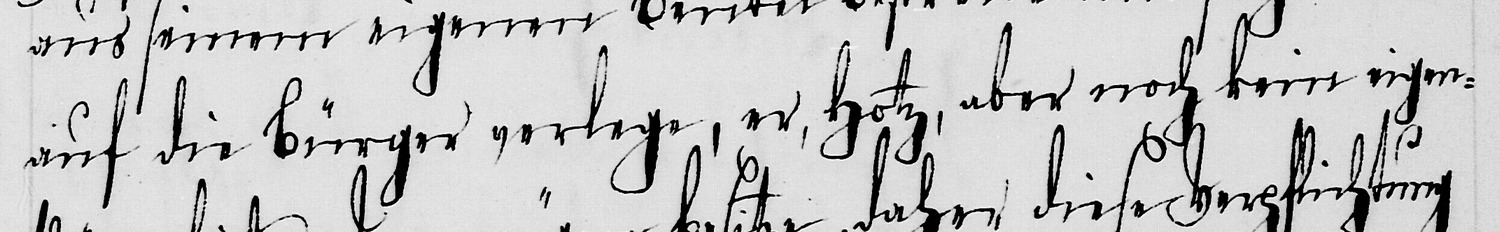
auf die Bürger verlege, er Hotz, aber noch kein eigen¬
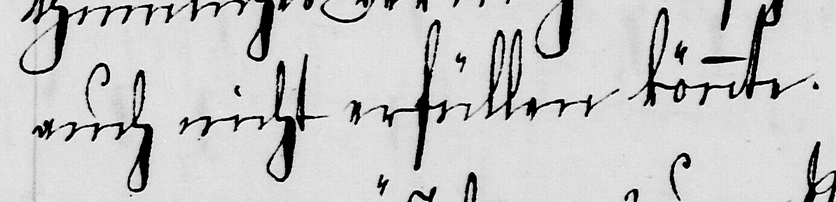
auch nicht erfüllen könnte.
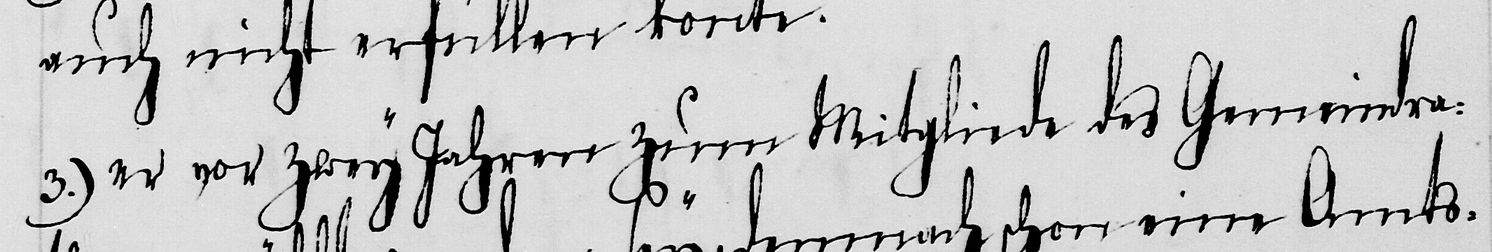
3.) er vor zwey Jahren zum Mitgliede des Gemeindra¬
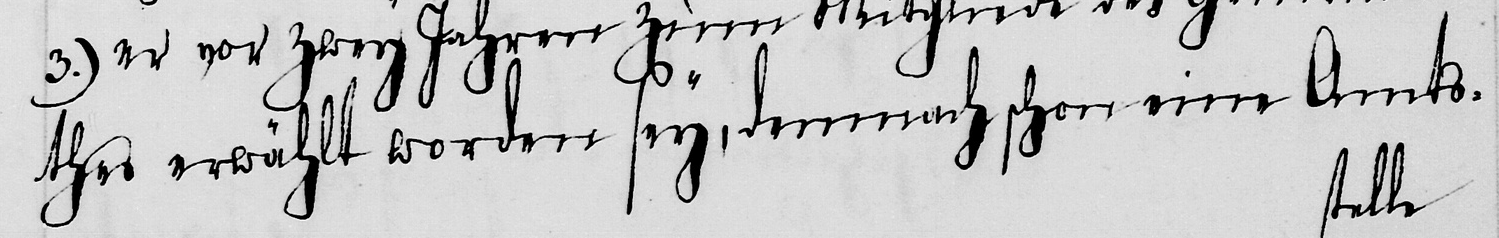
thes erwählt worden sey, demnach schon eine Amts-
